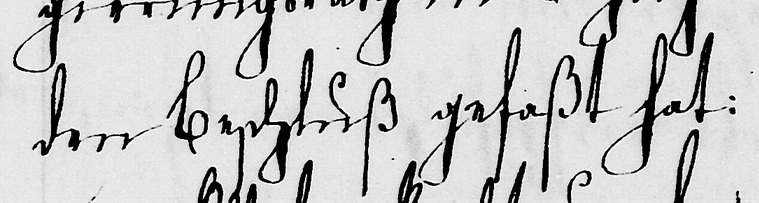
nden Beschluß gefaßt hat:
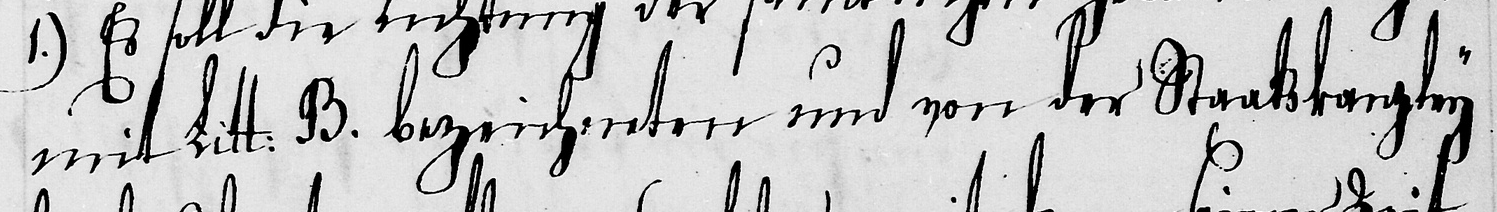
mit Litt: B. bezeichneten und von der Staatskanzley
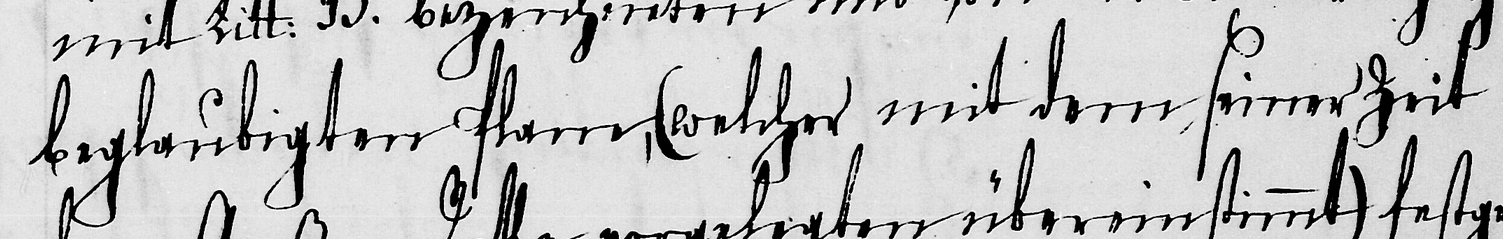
beglaubigten Plane, (welcher mit dem seiner Zeit
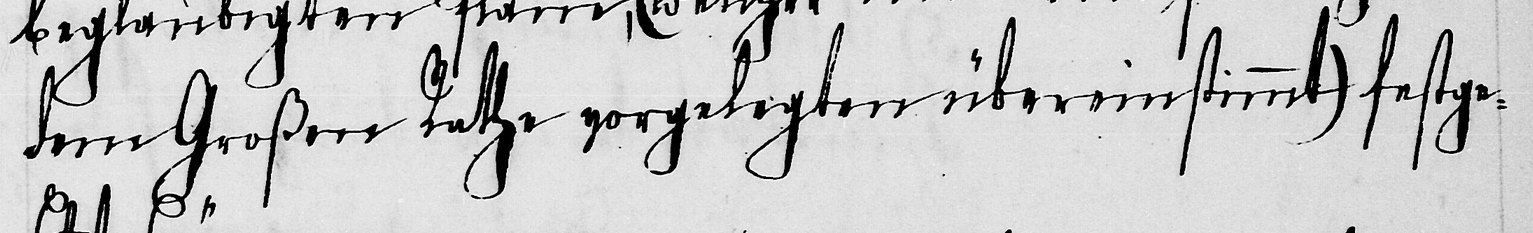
dem Großen Rathe vorgelegten übereinstimmt) festge¬
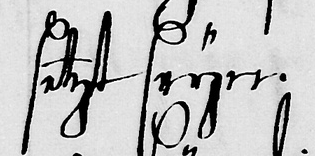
setzt seyn.
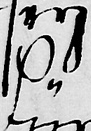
1.)
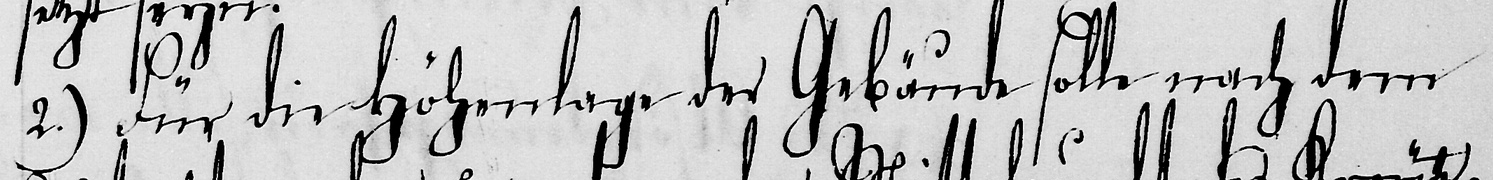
2.) Für die Höhenlage der Gebäude solle nach dem
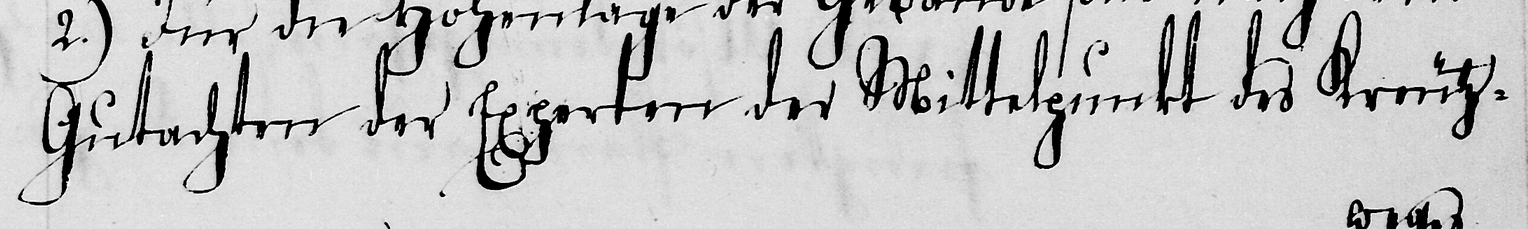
Gutachten der Experten der Mittelpunkt des Kreutz-
